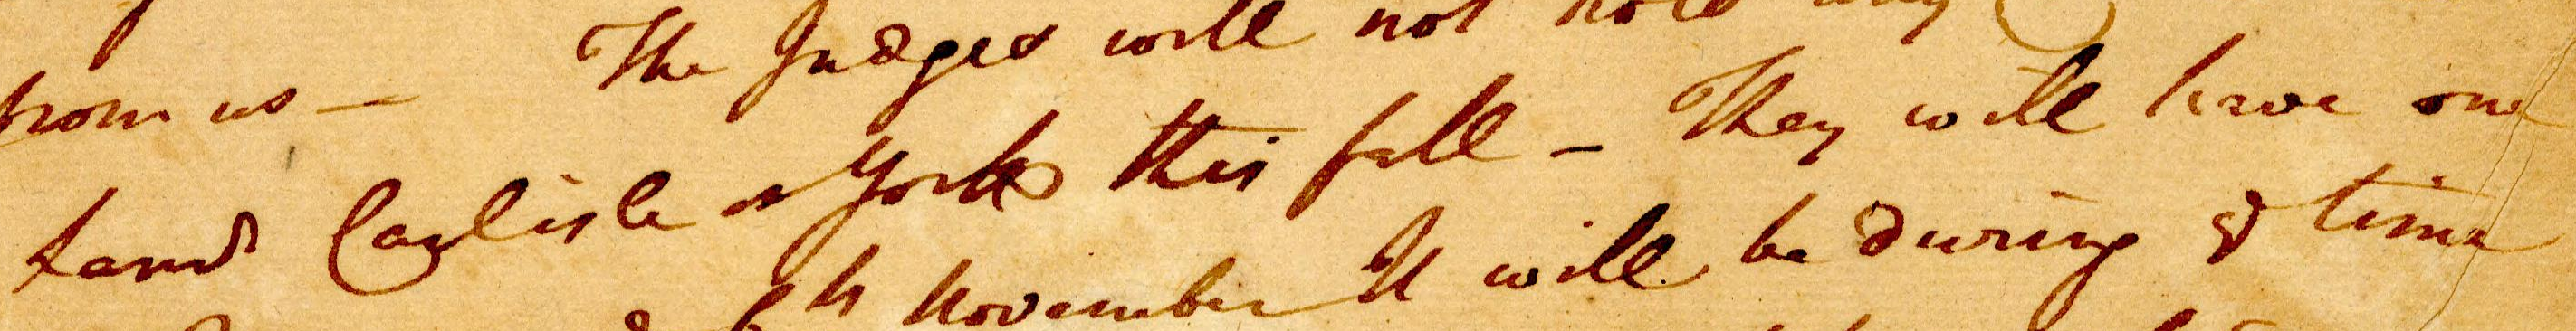Lam^r Carlisle or York this fall. They will have one
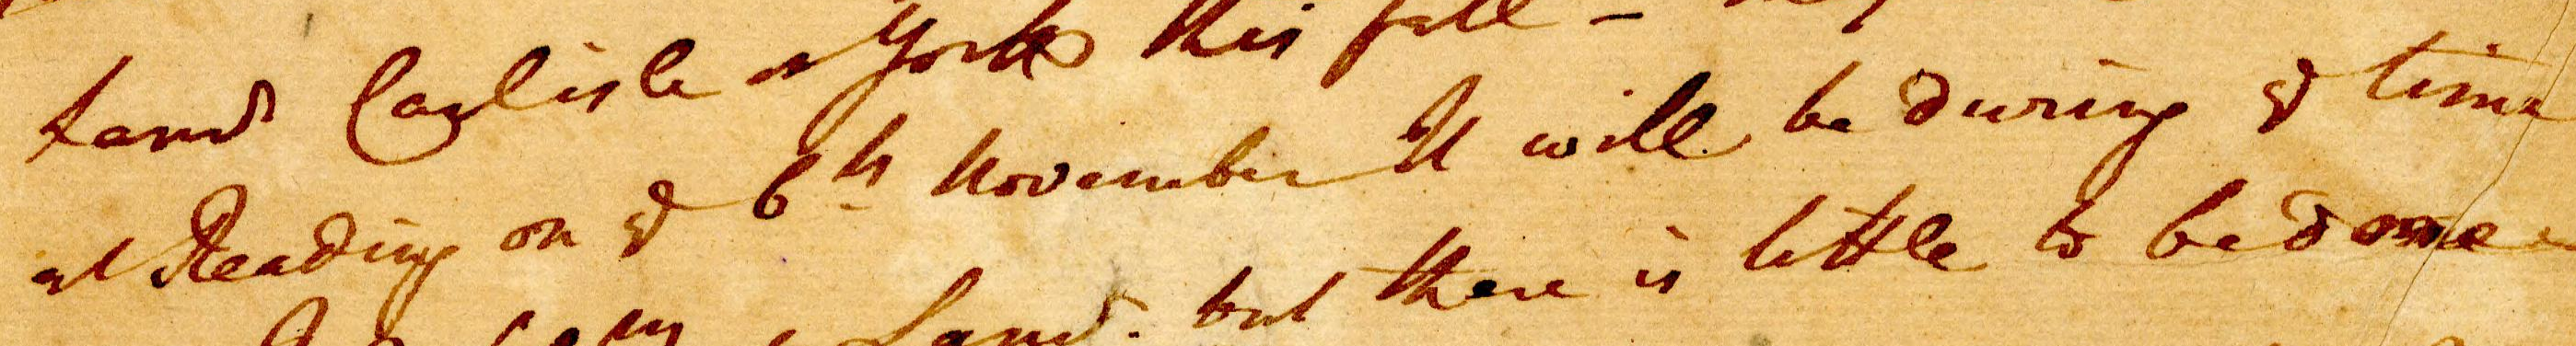at Reading on y^e 6^th November It will be during y^e time
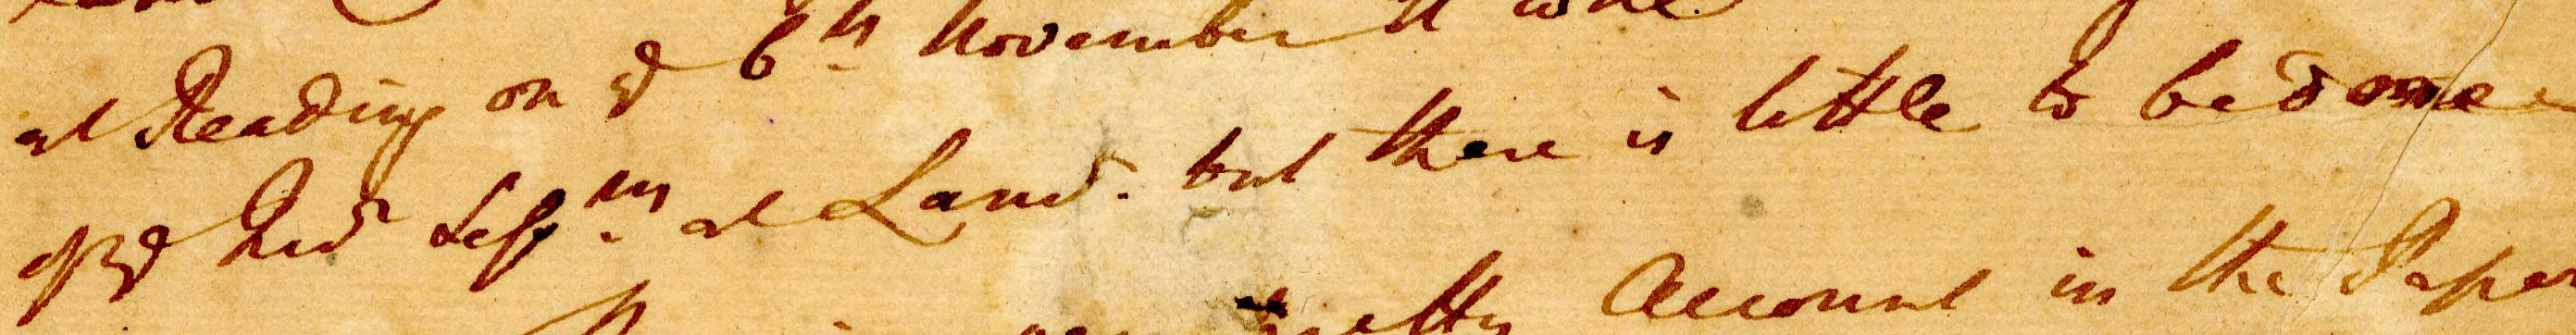of y^e Qu^t Less^trys. at Land but there is little to be done.
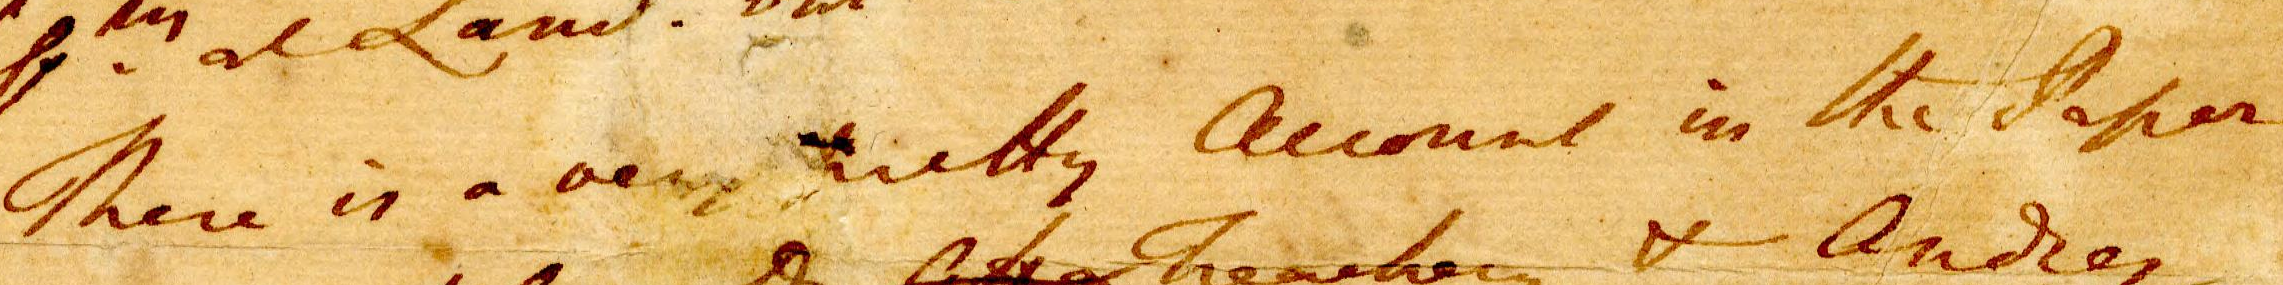There is a very pretty Account in the Paper
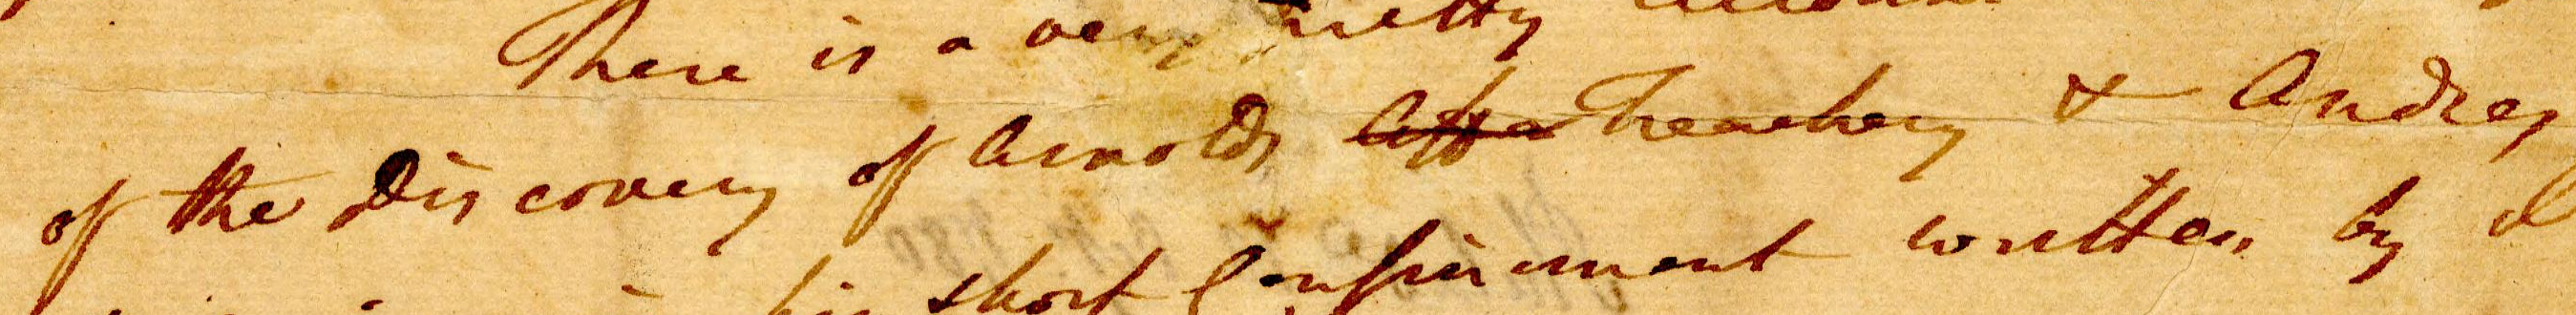of the Discovery of Arnolds Affair Treachery & Andres
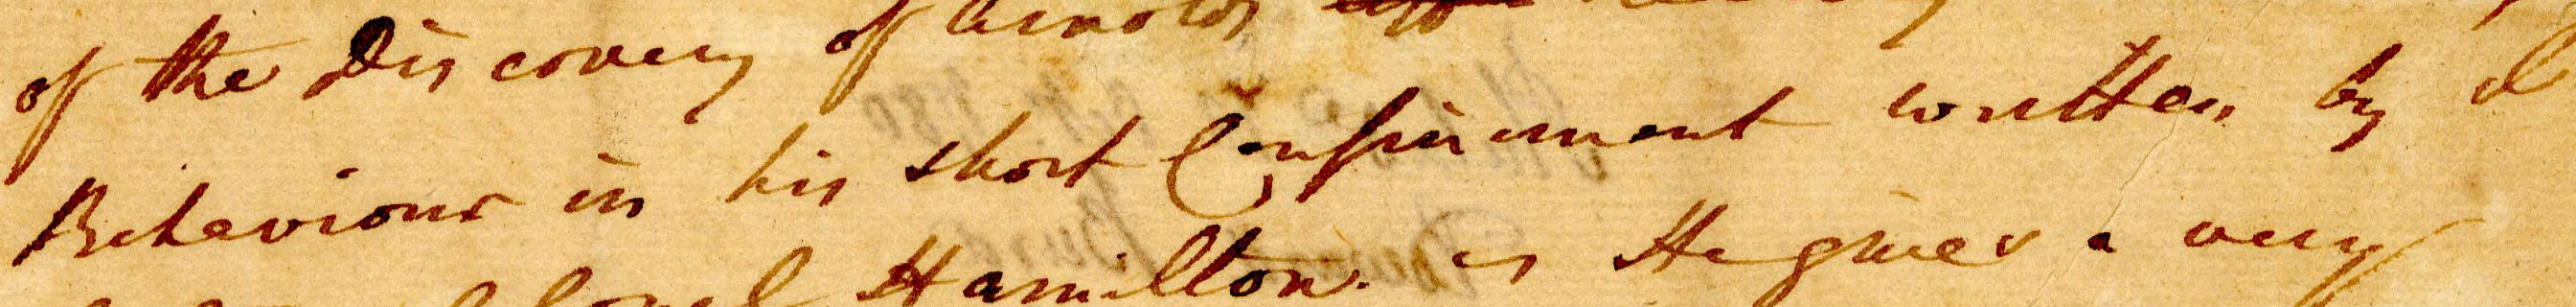Behaviour in his short Confinement written by I
